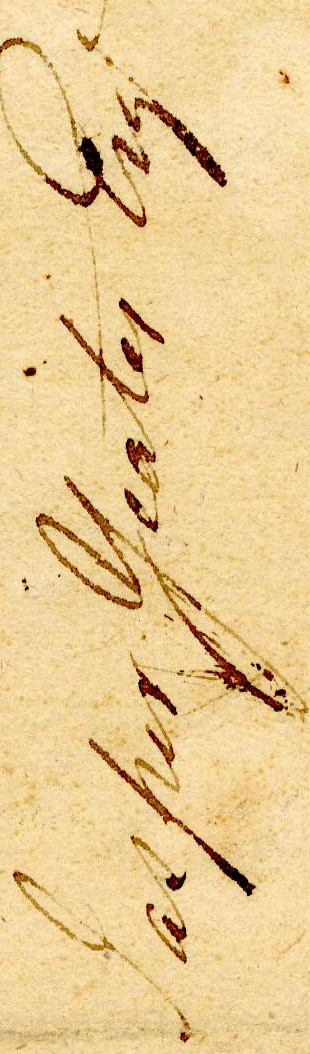Jasper Yeates Esq^r
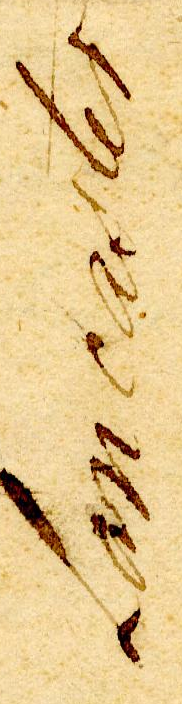Lancaster
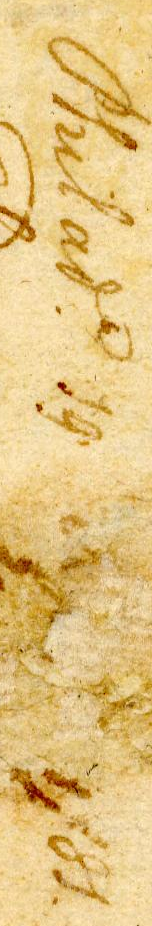Philad^a. 1781
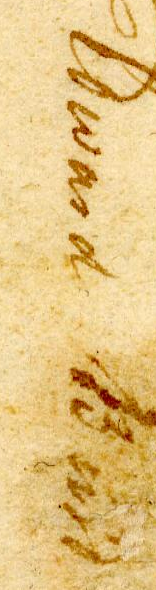Edward Burd
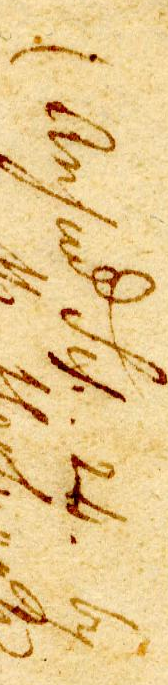(Answ^d Sep. 24. by
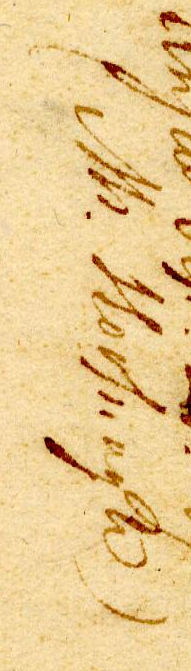M^r. Hoofnagle)
